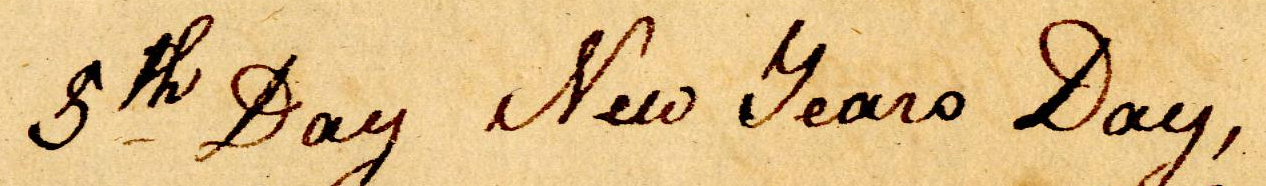5^th Day New Years Day,
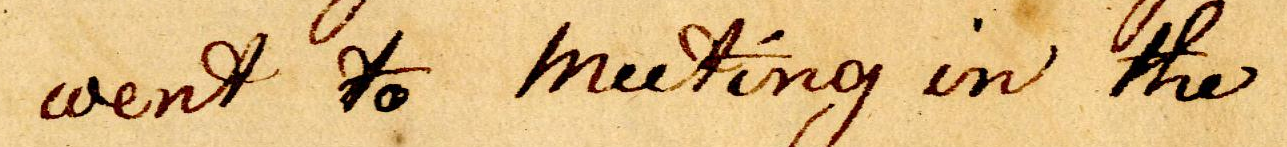went to Meeting in the
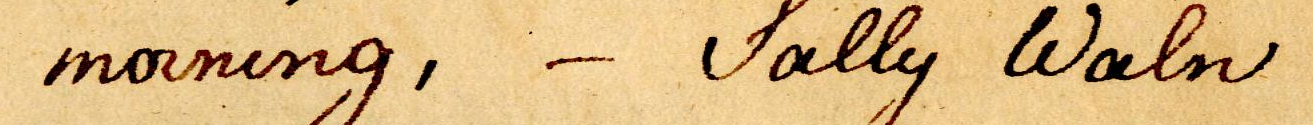morning,- Sally Waln
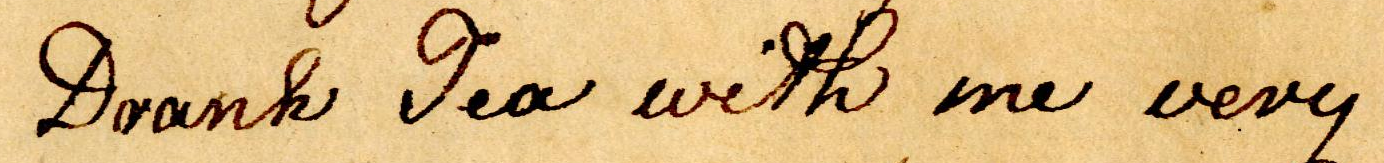Drank Tea with me very
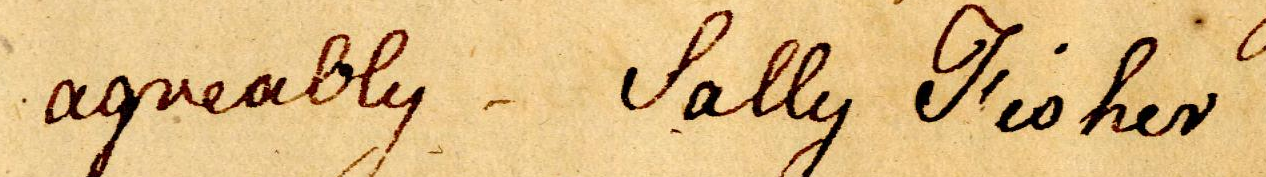agreably- Sally Fisher
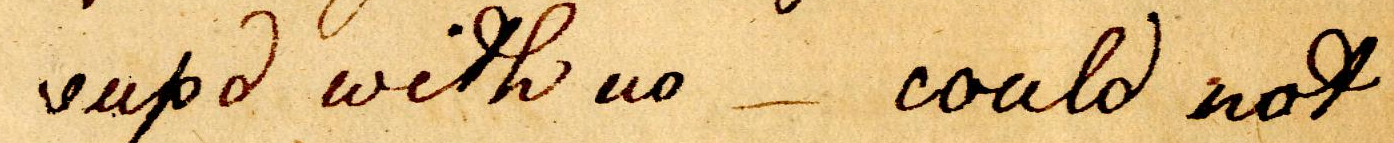supd with us- could not
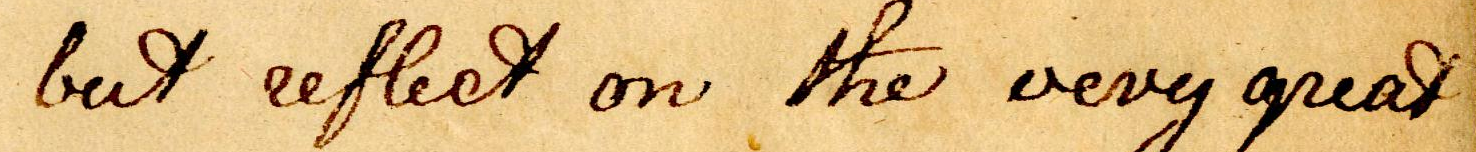but reflect on the very great
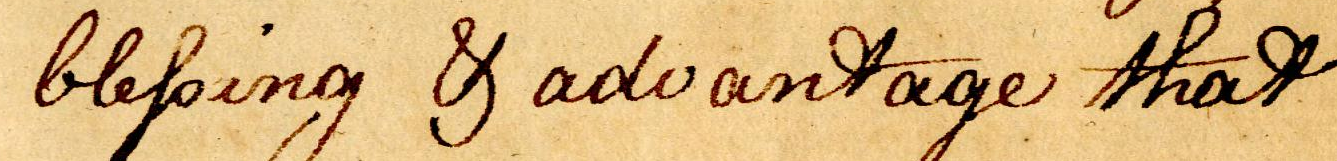blessing & advantage that
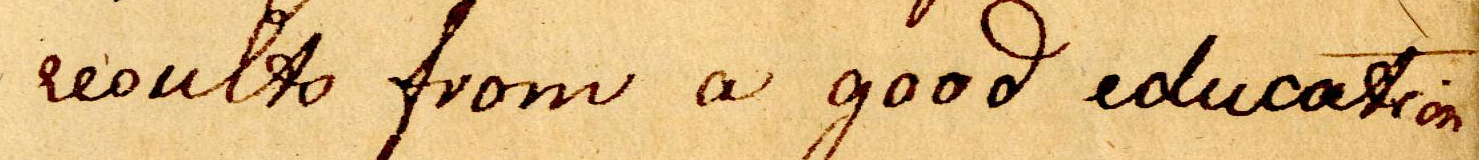results from a good education
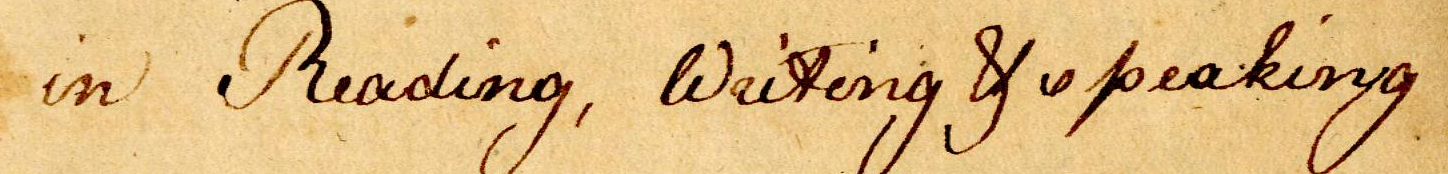in Reading, Writing & speaking
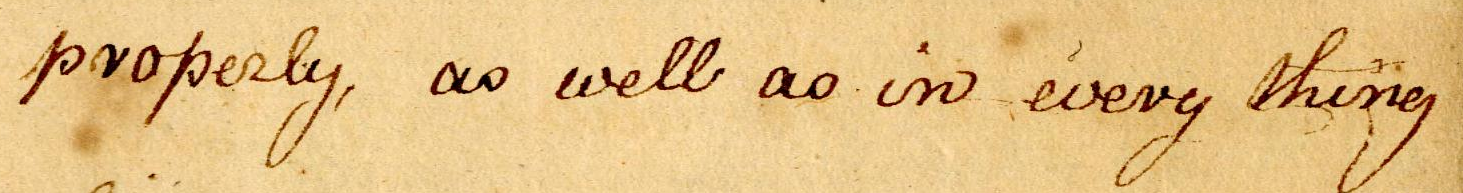properly, as well as in every thing
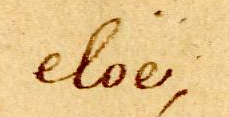else,
